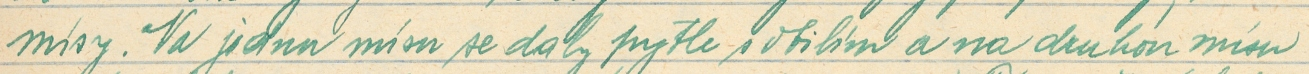mísy. Na jednu mísu se daly pytle s obilím a na druhou mísu
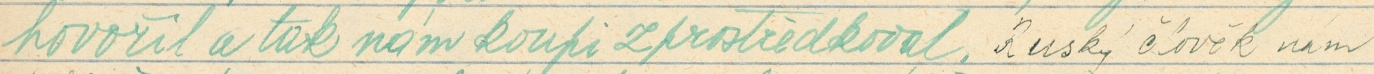hovořil a tak nám koupi zprostředkoval. Ruský člověk nám
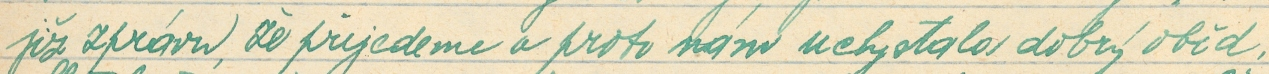již zprávu, že přijedeme a proto nám uchystala dobrý oběd.
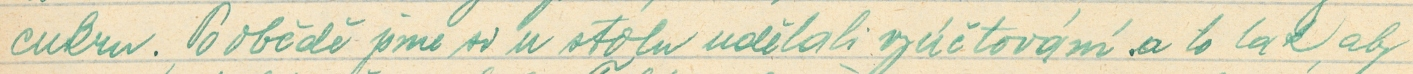cukru. Po obědě jsme si u stolu udělali vyúčtování a to tak, aby
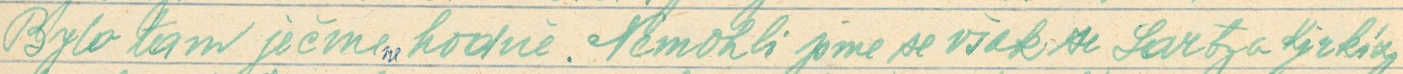Bylo tam ječmene hodně. Nemohli jsme se však se Sarty a Kirkízy
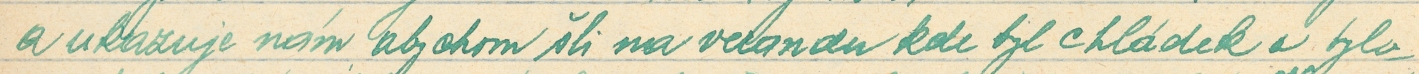a ukazuje nám, abychom šli na verandu kde byl chládek a byla
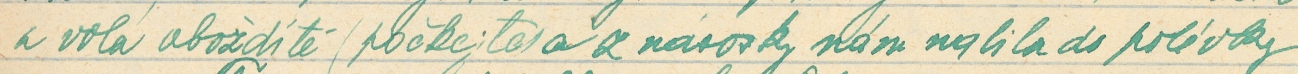a volá aboždítě (počkejte) a z nárosky nám nalila do polévky
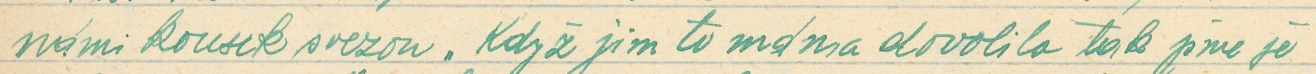námi kousek svezou. Když jim to máma dovolila tak jsme je
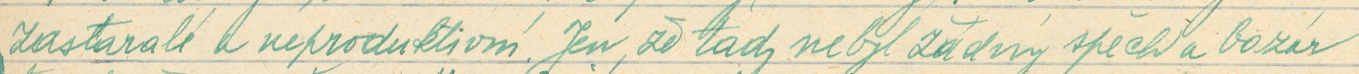zastaralé a neproduktivní. Jen, že tady nebyl žádný spěch a bazár
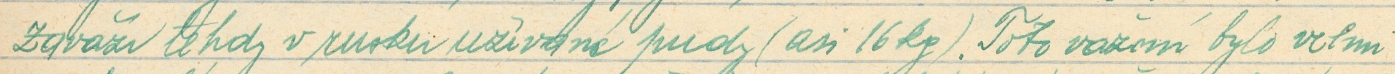zavaží tehdy v rusku užívané pudy (asi 16 kg). Toto važení bylo velmi
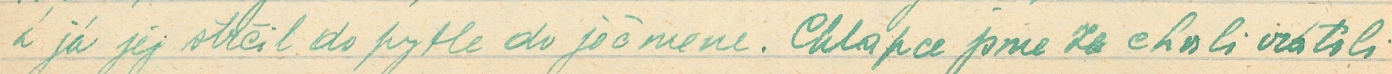a já jej strčil do pytle do ječmene. Chlapce jsme za chvili vrátili
